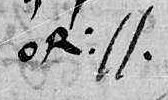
o R://.
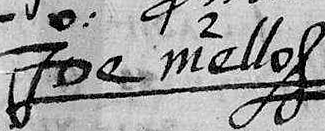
Jo de mello
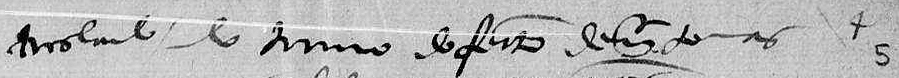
treslado do termo do feito de mte tomas
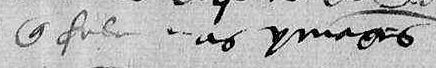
q̄ fala nas ymaḡes
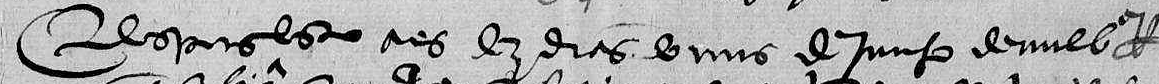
E despoes desto aos dez dias do mes de Junho de mil bc R
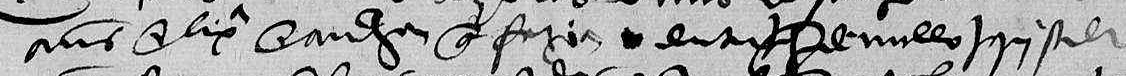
an̄s ē lixa ē audja q̄ fazia o doutor Joh̄ de mello Jnqujsidor
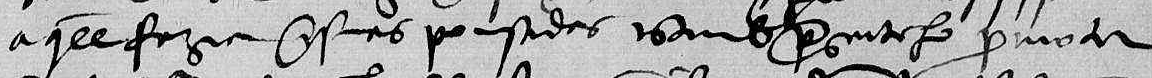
a q̄ll fazia ē suas pousadas estado p̄sente ho ꝓmotor
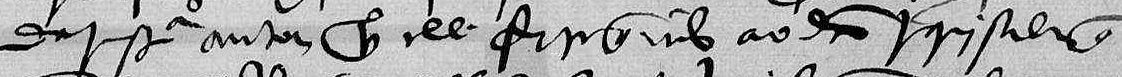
da Justa autor p̄o elle foj req̄rido ao dt̄o Jnqujsidor q̄
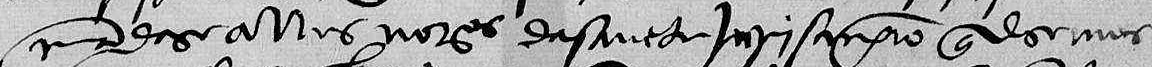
mādase a Nos notros da sancta Jnqujsição q̄ desemos
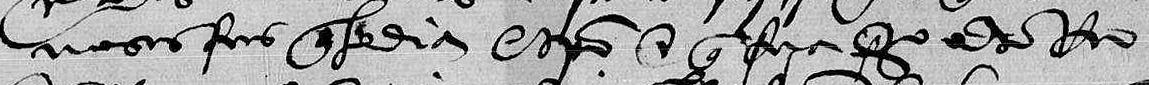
nosas fees q̄ ho dia e tpo ē q̄ fora p̄so o dtō Reo
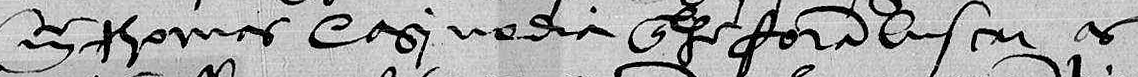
mte thomas e asy no dia q̄ lhe forā buscar as
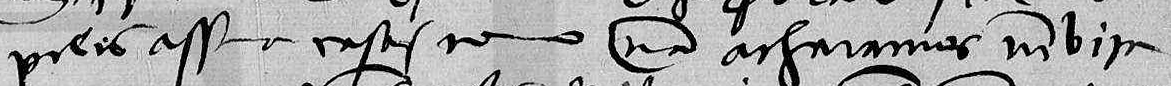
peles a ssua casas como nā acharamos nē vira
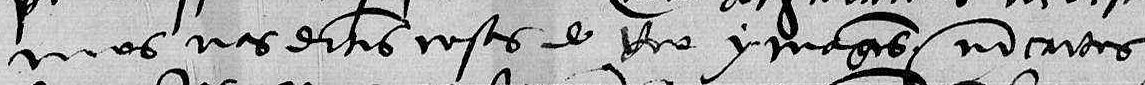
mos nas ditas casas do Reo ymaḡes / nē cartas
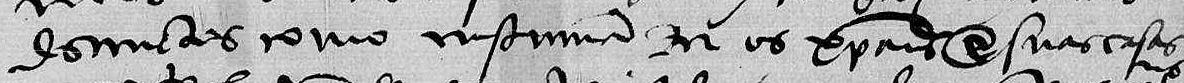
de samctos como custumā ter os xpãos ē suas casas
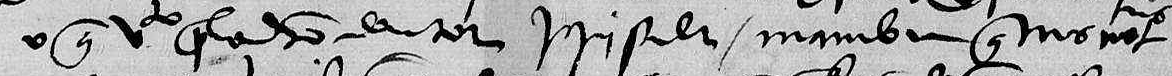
o q̄ vto p̄lo dt̄o doutor Jnqujsidor / mandou q̄ nos notros
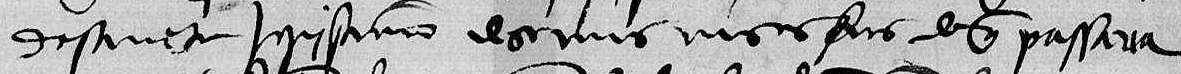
da sancta Jnqujsição desemos nosas fees do q̄ passara
